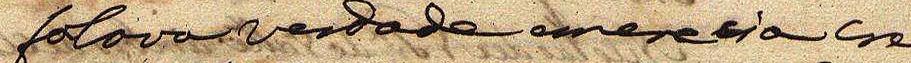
falava verdade e merecia cre
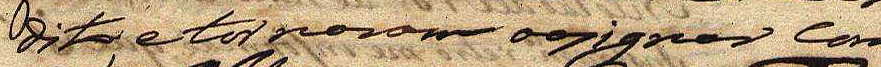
dito e tornaram a asignar com
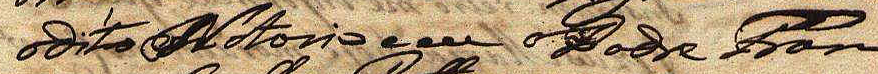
o dito Notario e eu o Padre Fran
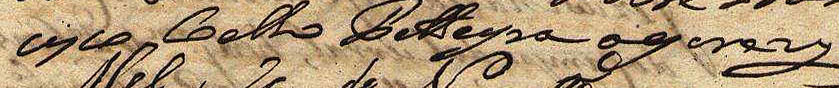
cisco Coelho Petteyra o escrevy
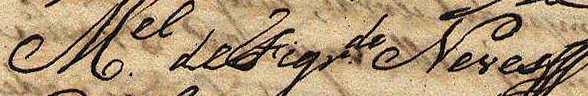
M.el de Figr.de Neves
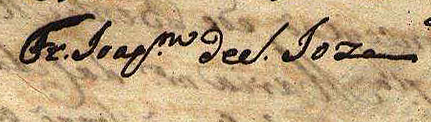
Fr. Ioaq.m de S. Ioze
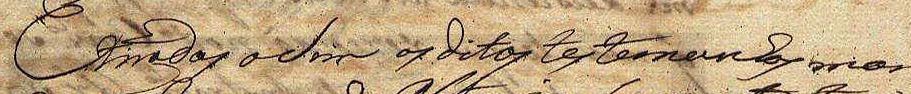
E assinados aSim os ditos testemunhos man
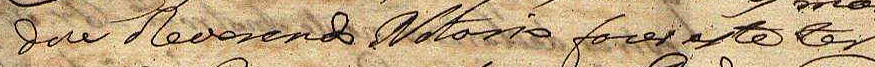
dou Reverendo Notario fazer este ter
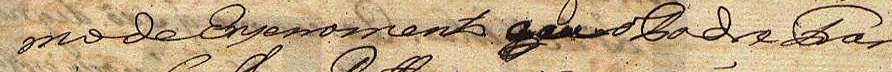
mo de Enserramento e eu o Padre Fran
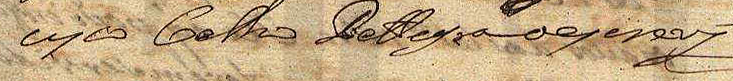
cisco Coelho Petteyra o escrevj
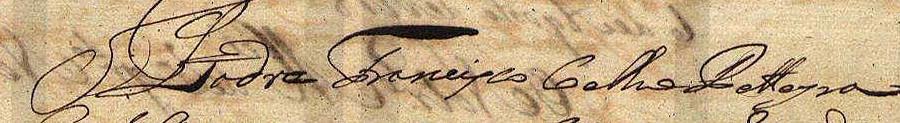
O Padre Francisco Coelho Petteyra
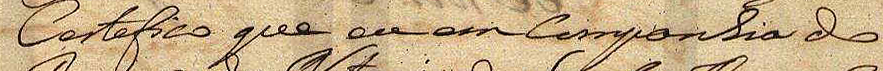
Certefico que eu em companhia do
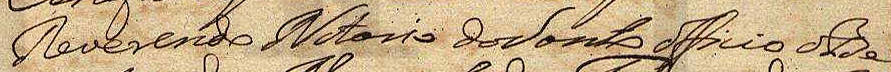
Reverendo Notario do Santo officio o Be
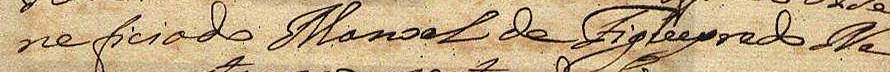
neficiado Manoel de Figueyredo Ne
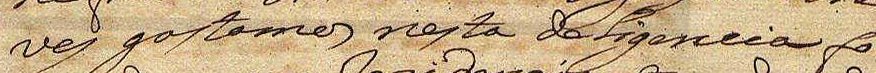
ves gastamos nesta deligencia fo
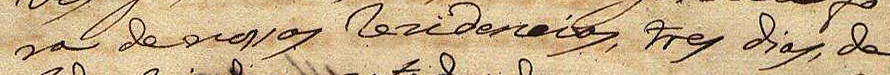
ra de nossas Rezidencias, tres dias, de
